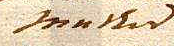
mulher
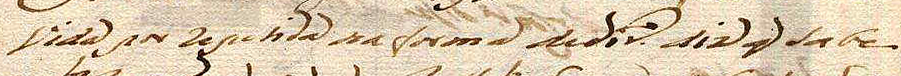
vida por Repetida na forma de dir.to diz q̄ sabe
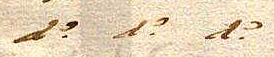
d.o d.o d.o
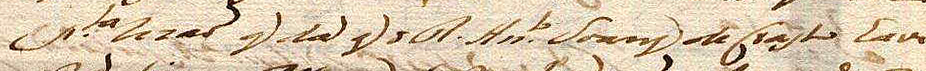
p.la Rezaõ q̄ da q̄ o R. An.to Soares de Crasto have
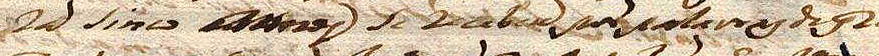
ra sinco annos se Recebeu por palavras de pRe
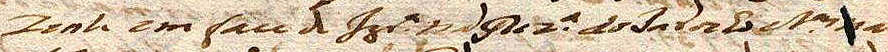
zente em face de Jgr.a na pRez.a do Parocho e t.as na
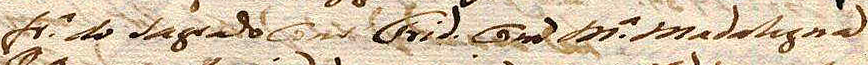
fr.a do sagrado Cons Trid. com m.a madalegna
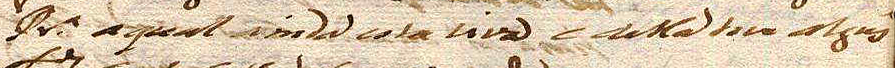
Pr.a a qual ainda esta viva e della teve algus̄
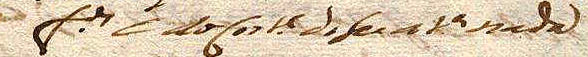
f.os e do Cost.e disse a t.a nada
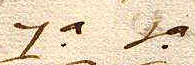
7.a t.a
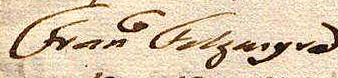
Franco Felgueyra
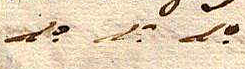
d.o d.o d.o
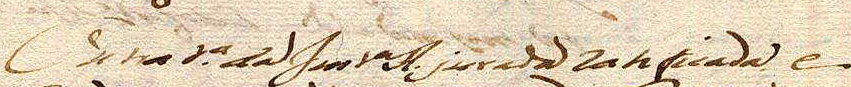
Outra t.a da Just.a A. jurada rateficada, e
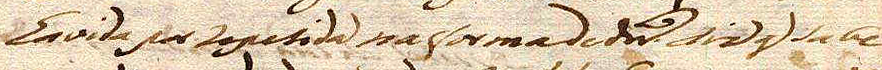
havida por repetida na forma de dir.to diz q̄ sabe
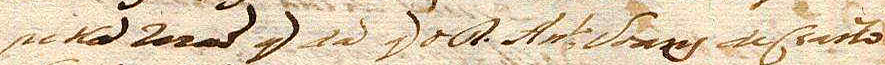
pella Rezaõ q̄ da q̄ o R. Anto Soares de Crasto
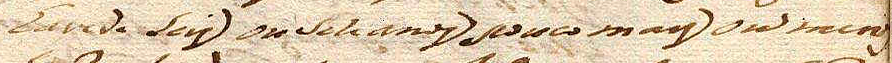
havido seis ou sete anos pouco mais ou menos
